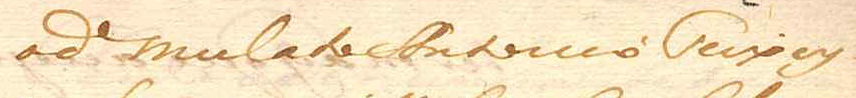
o do mulato Antonio Teixey
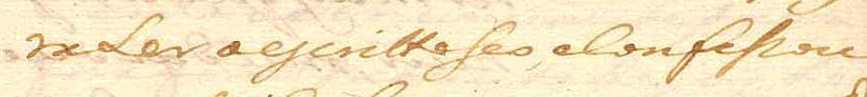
ra Ler o escritto seo, e Confessou
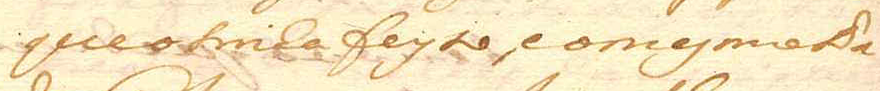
que o tinha feyto, e o mesmo Pa
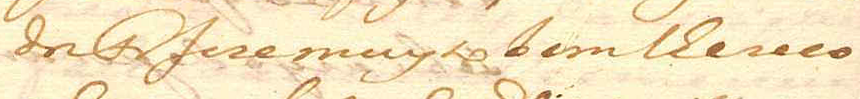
dre Fr Joze muyto bem lhe reco
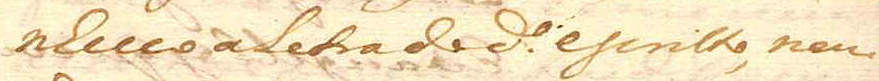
nheceo a Letra do d.o escritto, nen
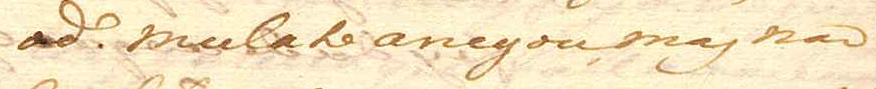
o d.o mulato a negou, mas naõ
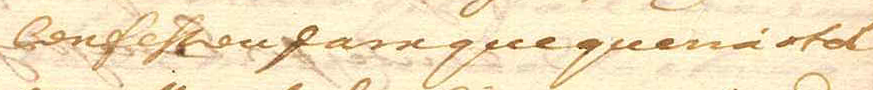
confessou para que queria o tal
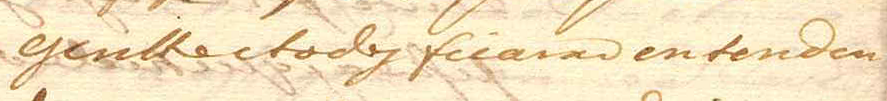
escritto e todos ficaraõ entenden
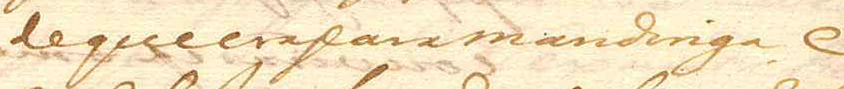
do que era para mandinga e
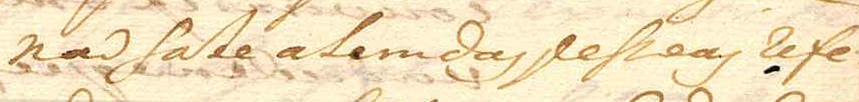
naõ sabe alem das pessoas Refe
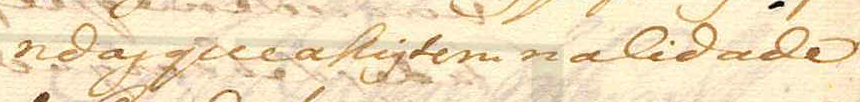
ridas que assistem na Cidade
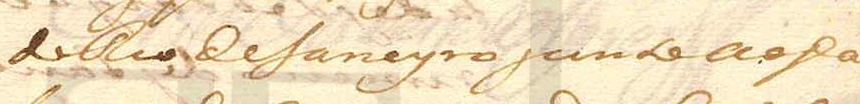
do Rio de Janeyro junto ao pa
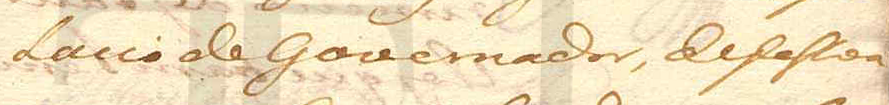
lacio do Governador, de pessoa
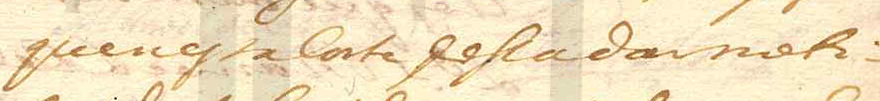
que nesta Corte possa dar noti
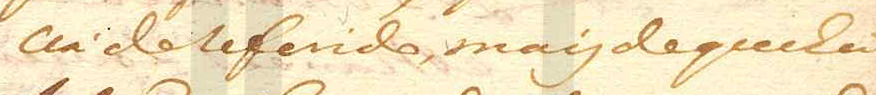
cia do Referido, mais do que hū
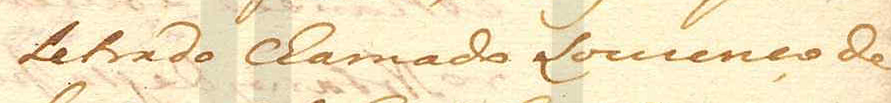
Letrado chamado Lourenço de
